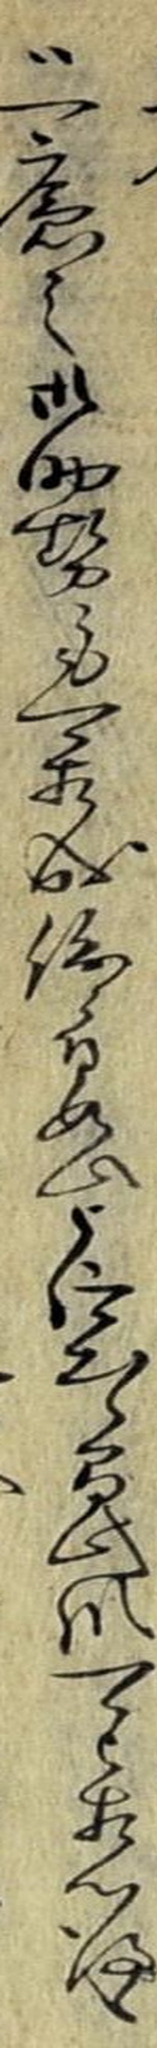ハ一応之御助勢ニも可相成儀ニ付如此被仰出候間此段可被相心得候
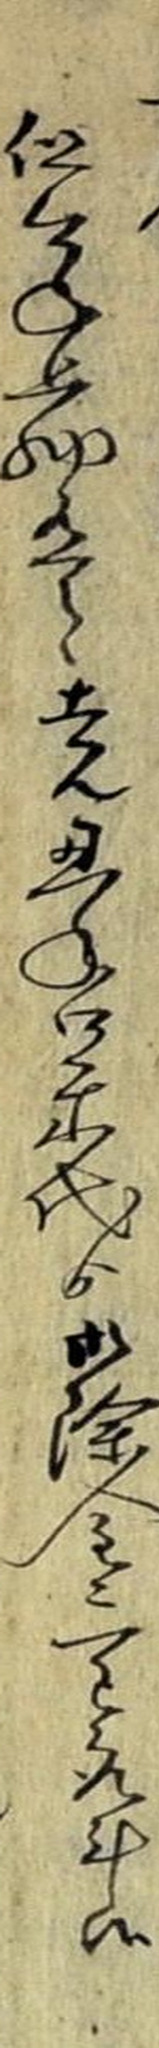但今年上納有之候去ル丑年口米代ゟ御除金ニ可被取計候
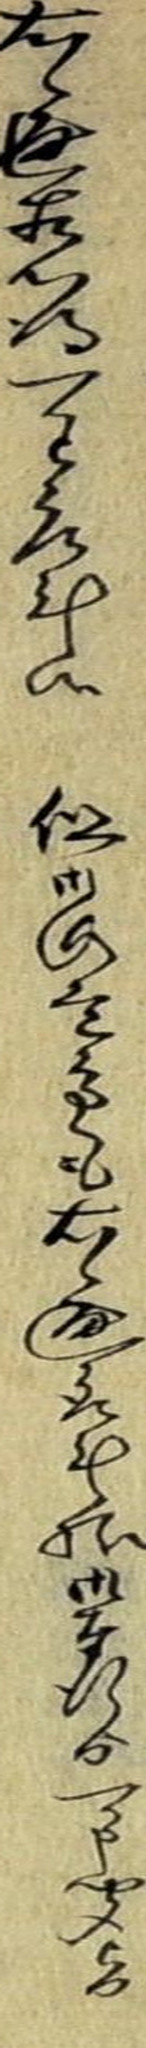右之通相心得可被取計候但御趣意方へも右之通取計候様御奉行ゟ可申聞旨
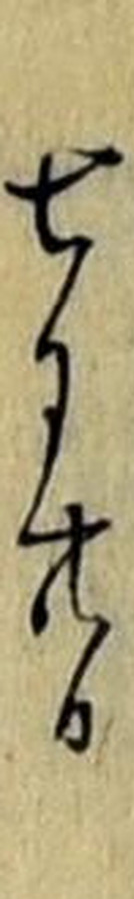七月廿日
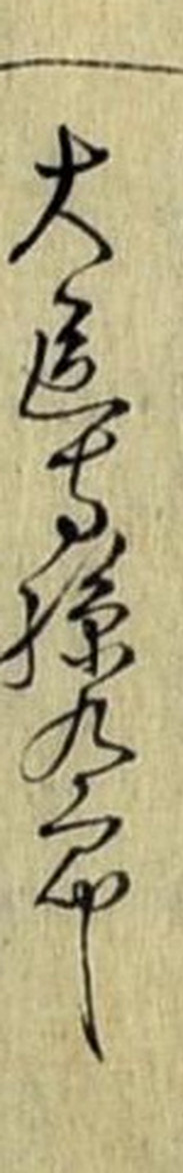大道寺孫九郎
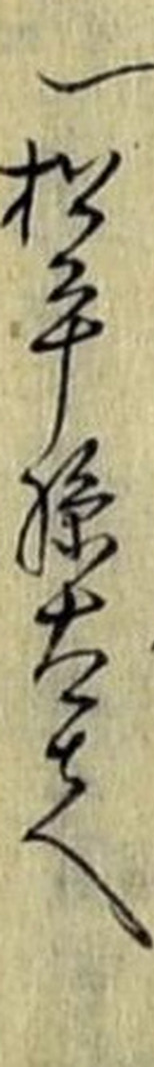松平源太夫
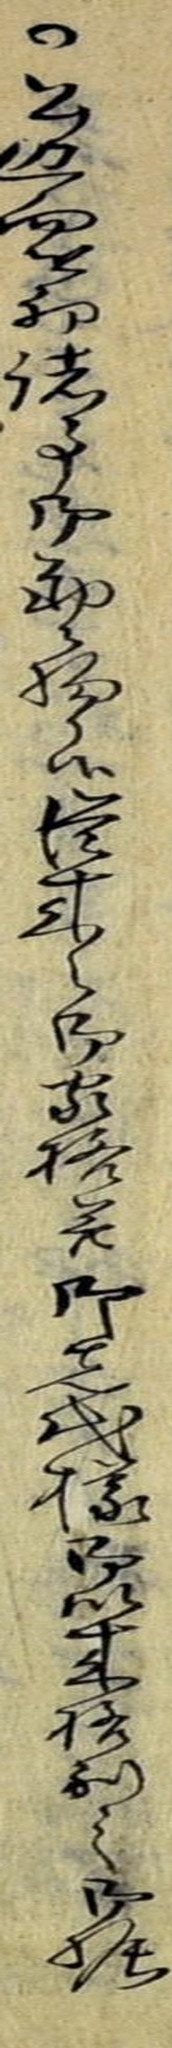〇公辺向を初諸事御勤ニ拘り候従来之御家格并御先代様御以来格別之御振
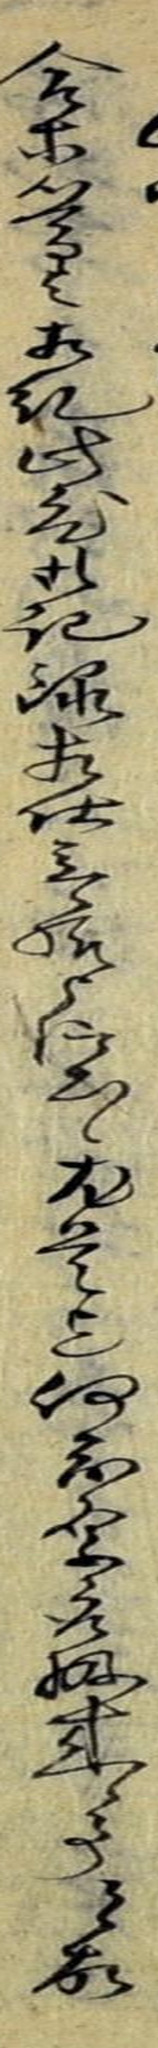合等篤与相糺此度御記録相仕立候様被仰出候尤是迄何茂厚取扱来候事ニ候故
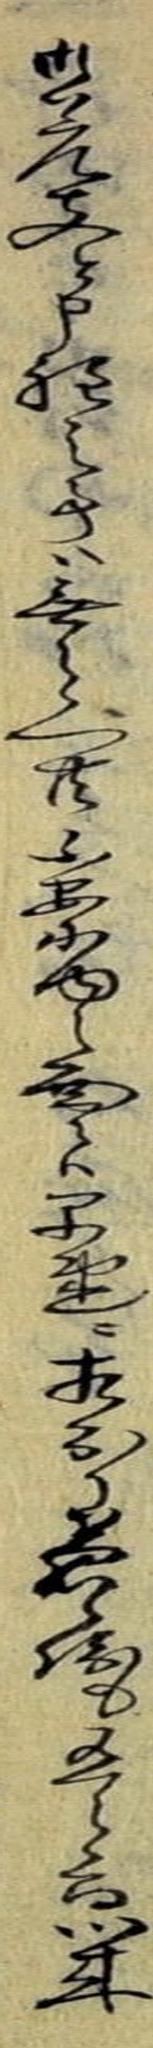御差支と申程之事ハ無之候へ共不案内之面々ハ早速ニ相分り兼候儀も有之候間以来
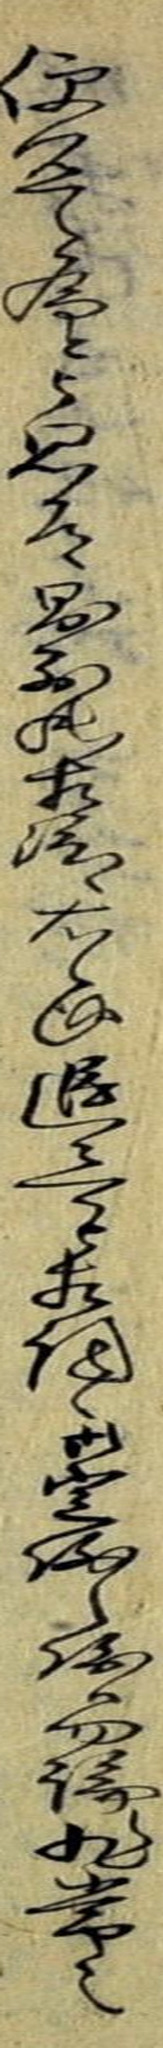便宜之為と被思召候則別紙相渡候右之趣追々可被相調候御定例之儀ハ勿論非常之
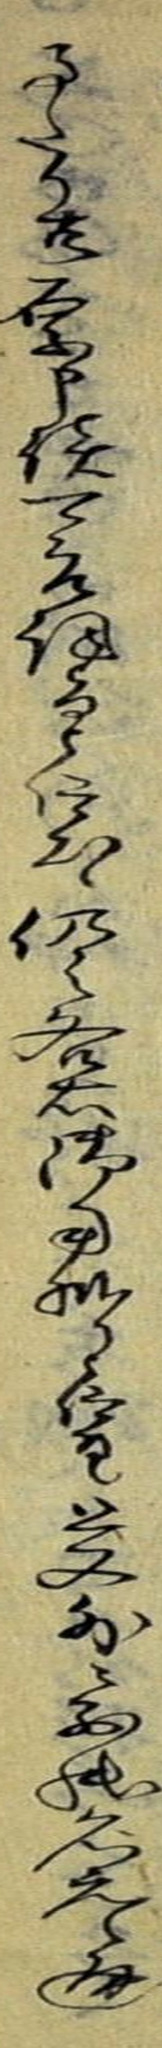事たり共厚申談可被取調旨被仰出候仍之各右御用掛り被仰付候且又外ニ別紙名元之通
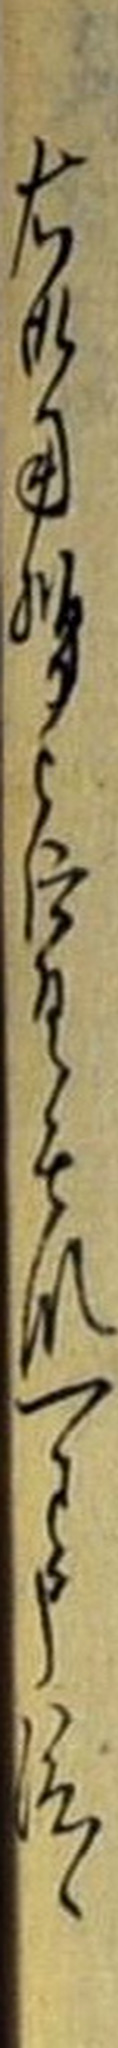右御用掛り被仰付候其段可被申渡候
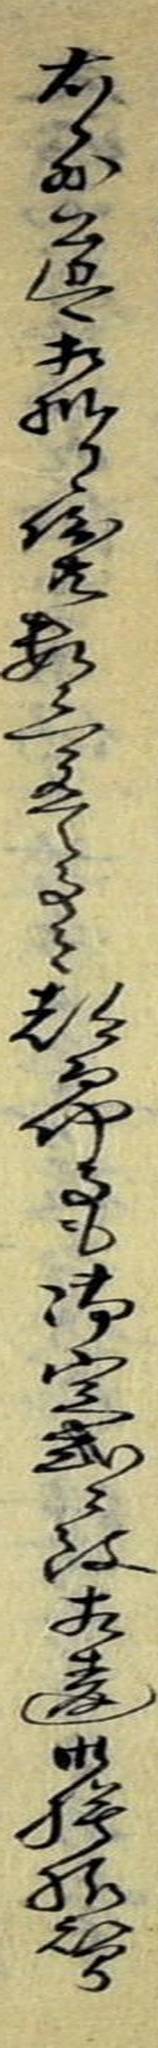右之外公辺へ相掛り候儀共数々可有之事ニ候都而何事も御定式ニ致相違御模様替り
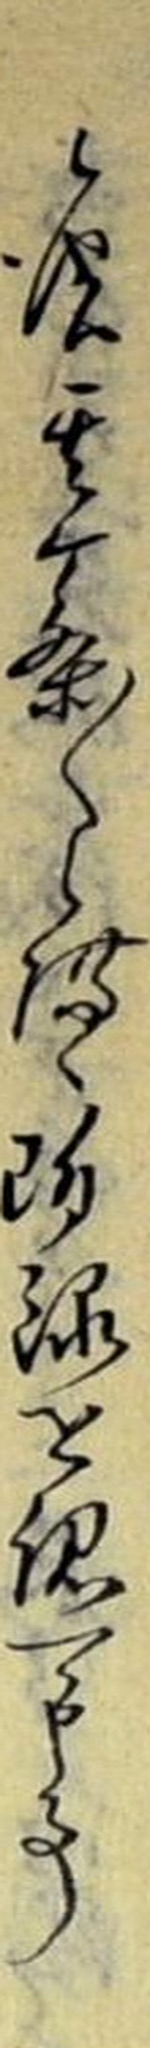候儀ハ其ケ条〳〵之場へ付線を認可申事
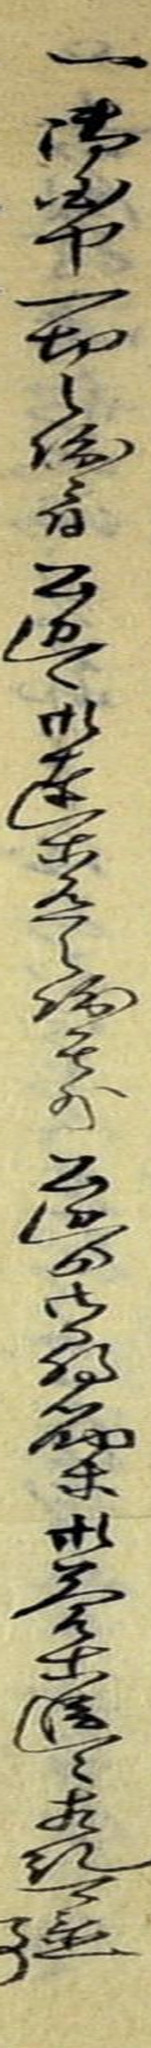一御国中一切之儀ニ付公辺へ御達等有之儀其外公辺ゟ御尋筋等御答等追々相糺可置事
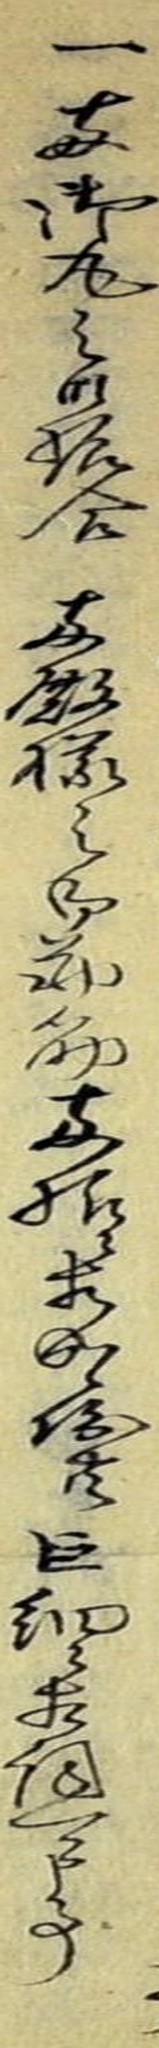一両御丸之御振合両殿様之御勤筋両様ニ相成候儀共巨細ニ相調可申事
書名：命令之部 三
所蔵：福井県文書館 Fukui Prefectural Archives
